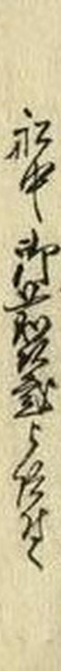船中御前頂戴被仰付候
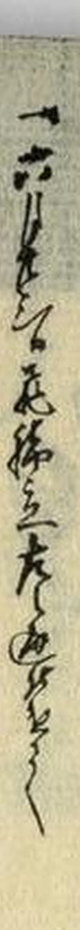一六月廿三日飛脚立左之通被遣之
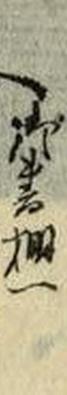御書棚一
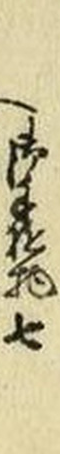御手遊物七
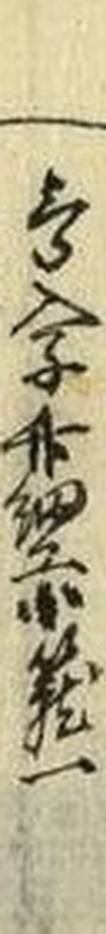三ツ入子竹細工小籠一
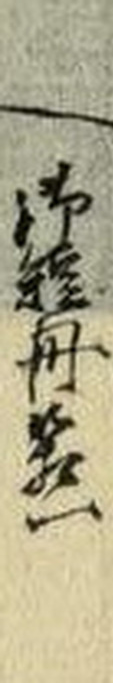御短冊箱一
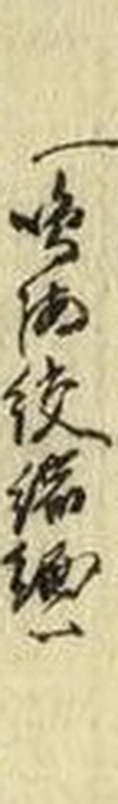鳴海絞縮緬一
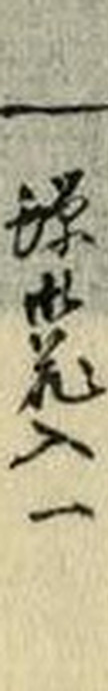蝶御花入一
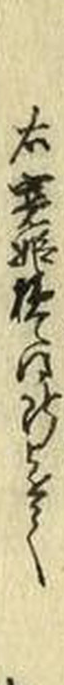右寛姫様へ同断被進之
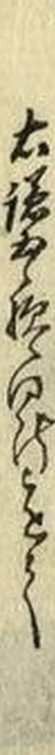右謙五郎様へ同断被進之
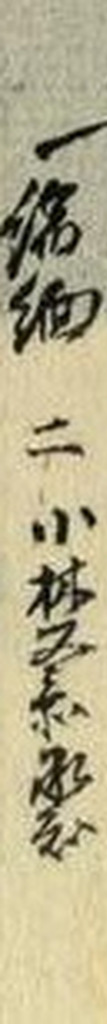縮緬二小林又兵衛承知
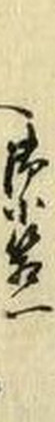御小箱一
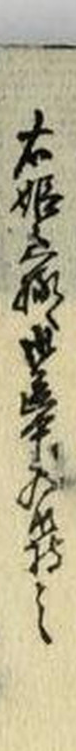右姫君様へ御道中為御持之
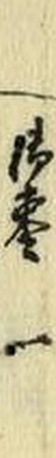御棗一
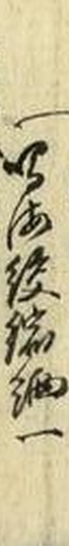鳴海絞縮緬一
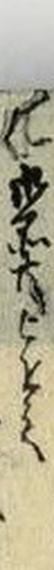御品共被進之
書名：少傅日録抄（斉承付側向頭取日記、在国）
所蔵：福井県文書館 Fukui Prefectural Archives
